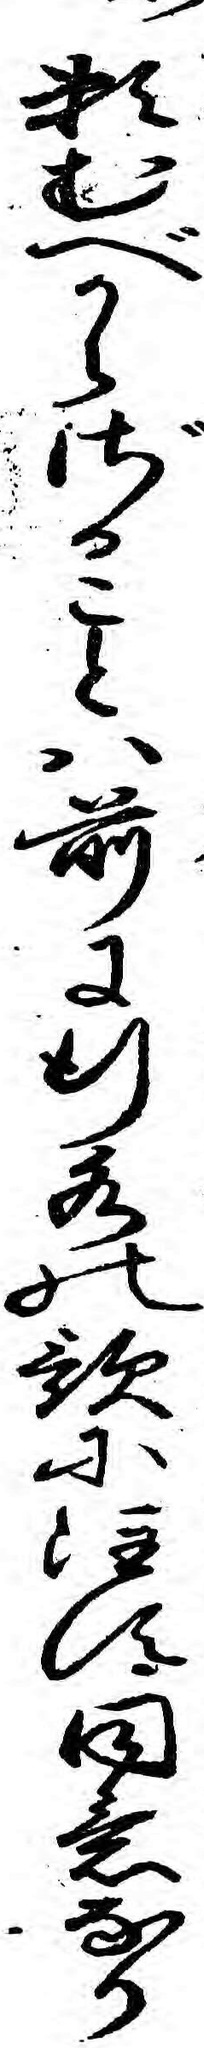頼むべからざることは前に行水の歌に注す同意なり
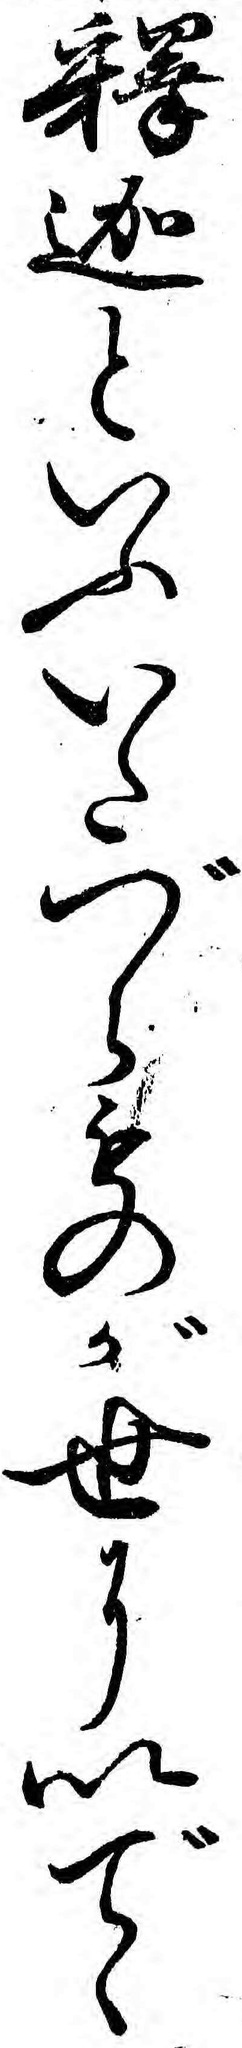釈迦といふいたづらものが世にいでゝ
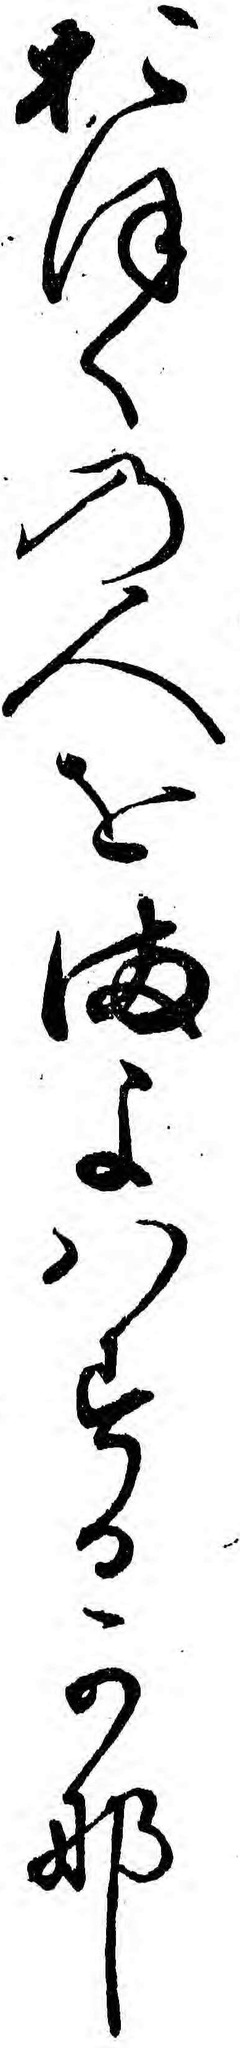おほくの人をまよはするかな
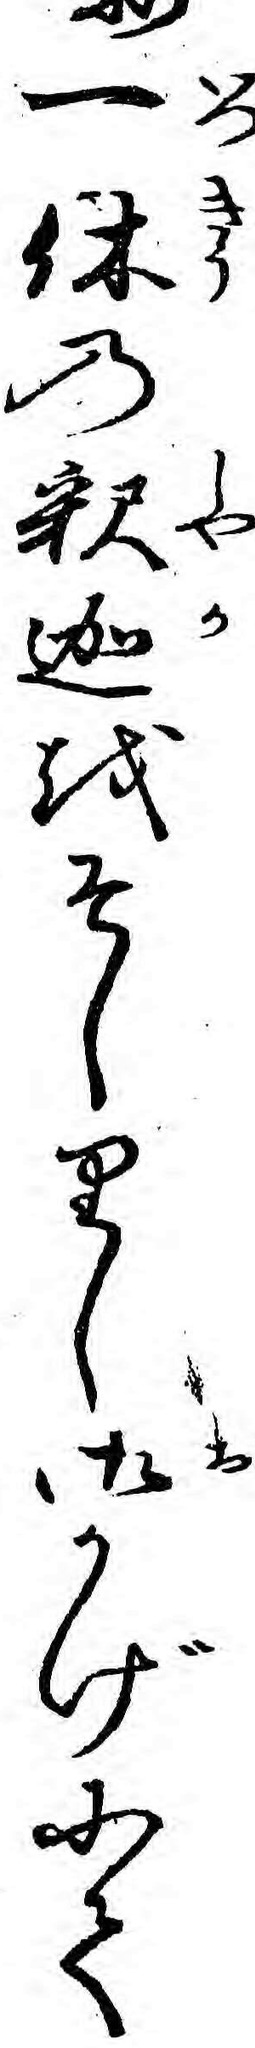一休）の釈迦をそしりし御かげにて
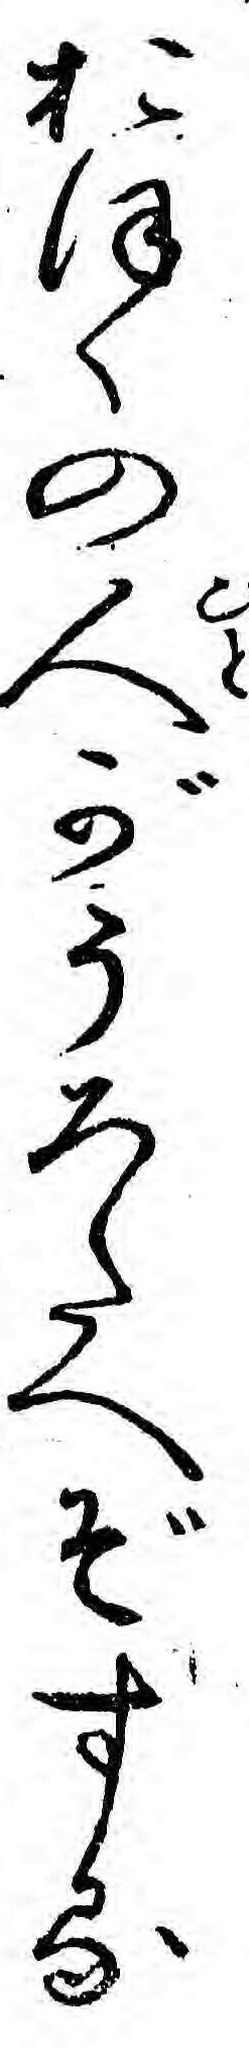おほくの人がうろたへぞする

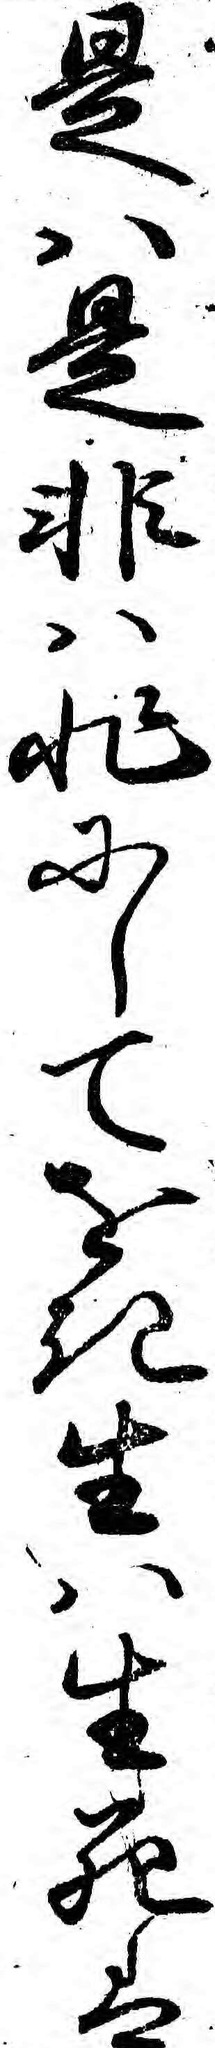是は是非は非にしてをき生は生死は
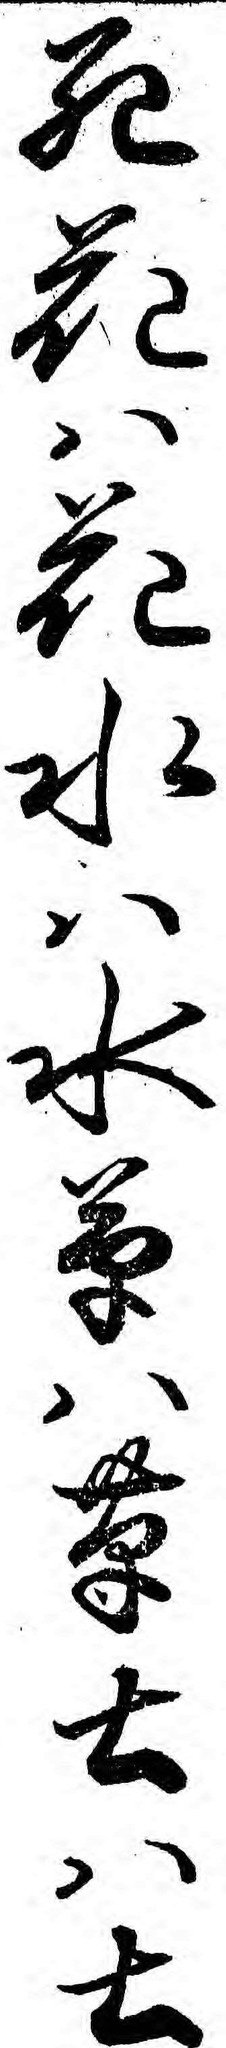死花は花水は水草は草土は土
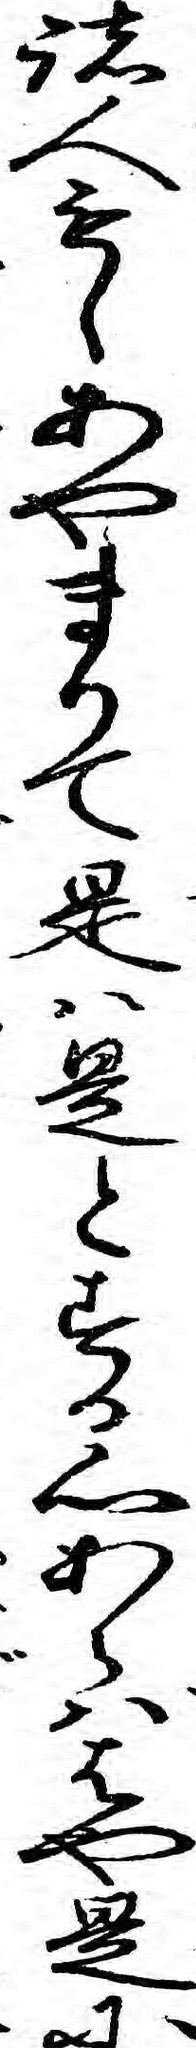諸人もしあやまりて是は是とする心あらばはや是に
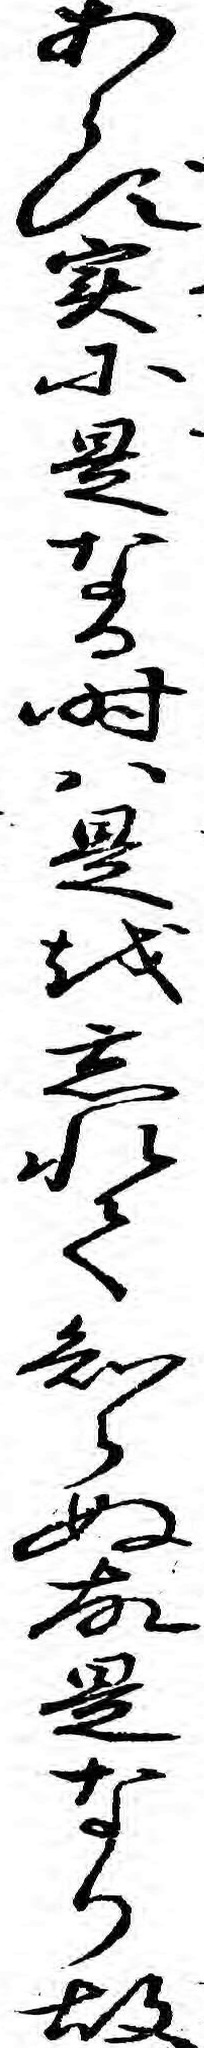あらず実に是なる時は是を忘れて知らぬ故是なり故
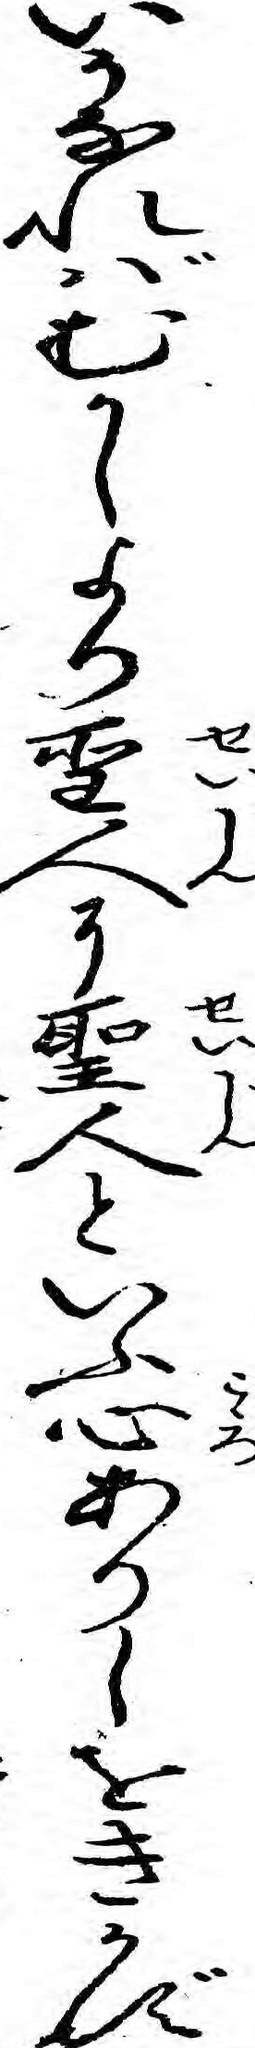いかなればむかしより聖人に聖人といふ心ありしをきかず
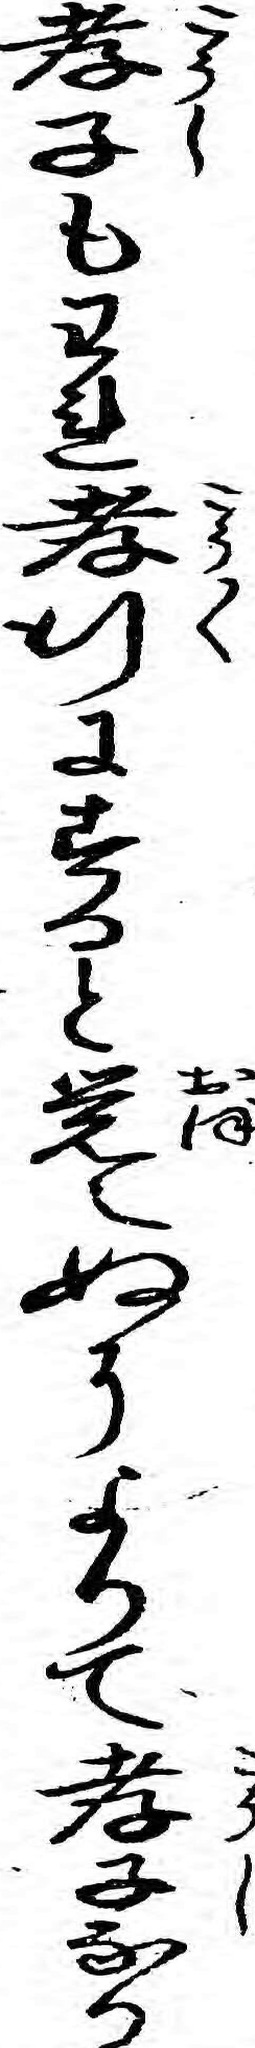孝子もわれ孝行にすると覚えぬによりて孝子なり
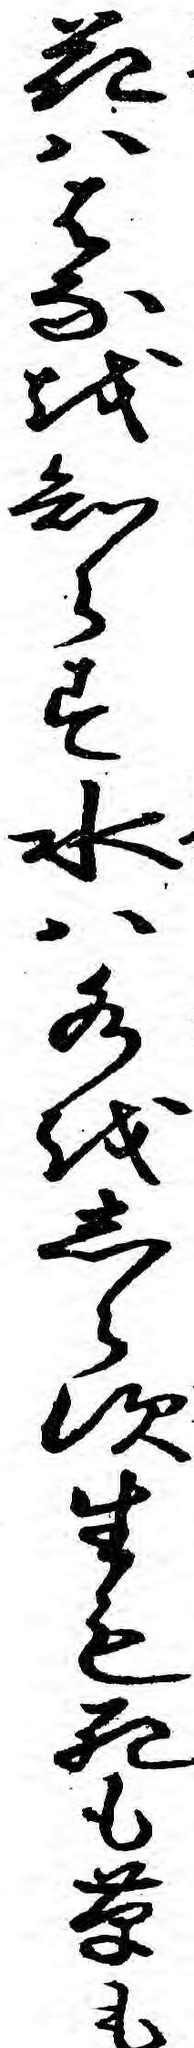花ははなを知らす水は水をしらず生しやうも死も草も
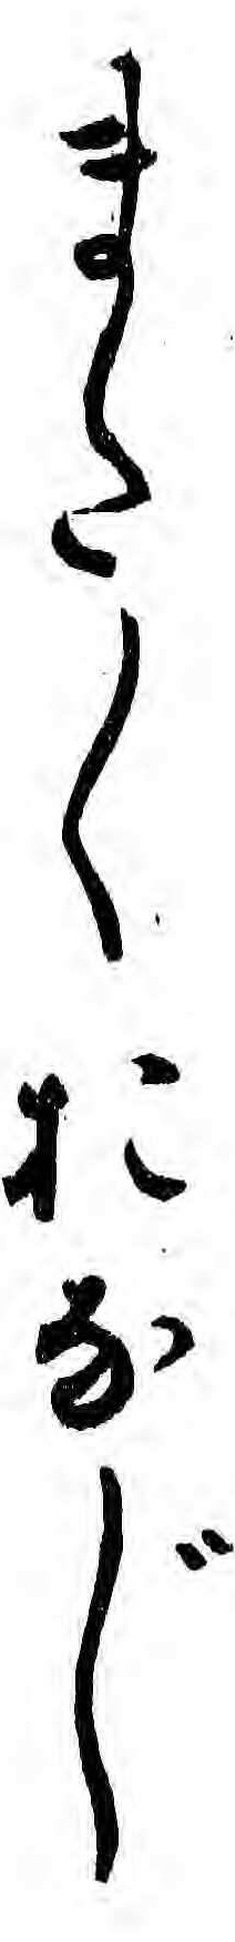また〳〵おなし
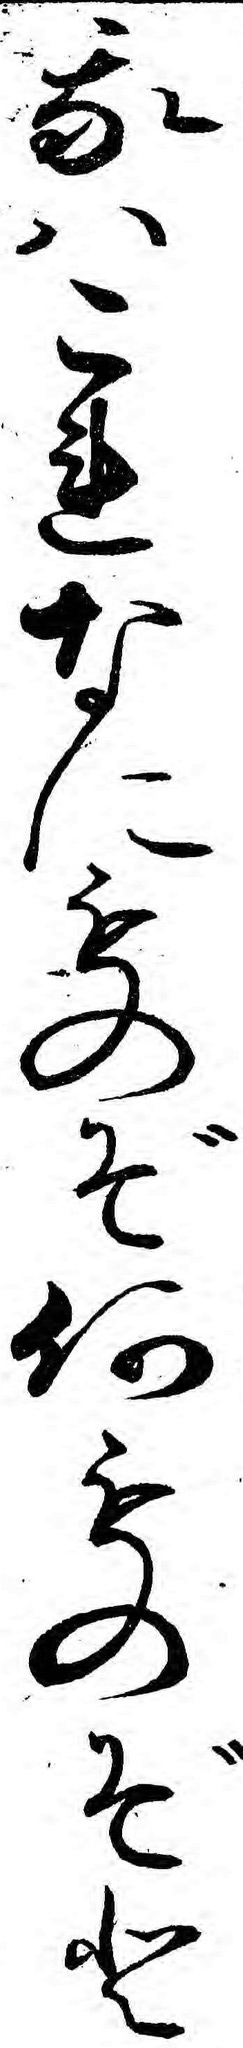我はこれなにものぞ何ものぞと
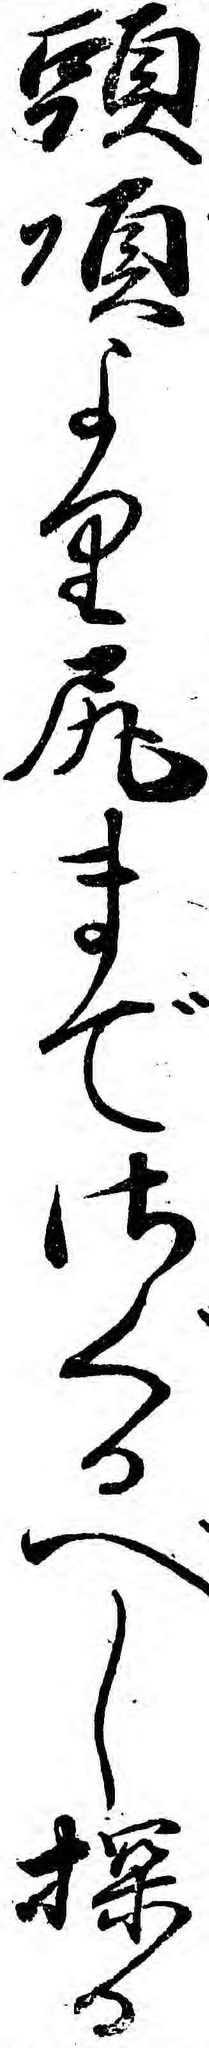頭項より尻までさぐるべし探る
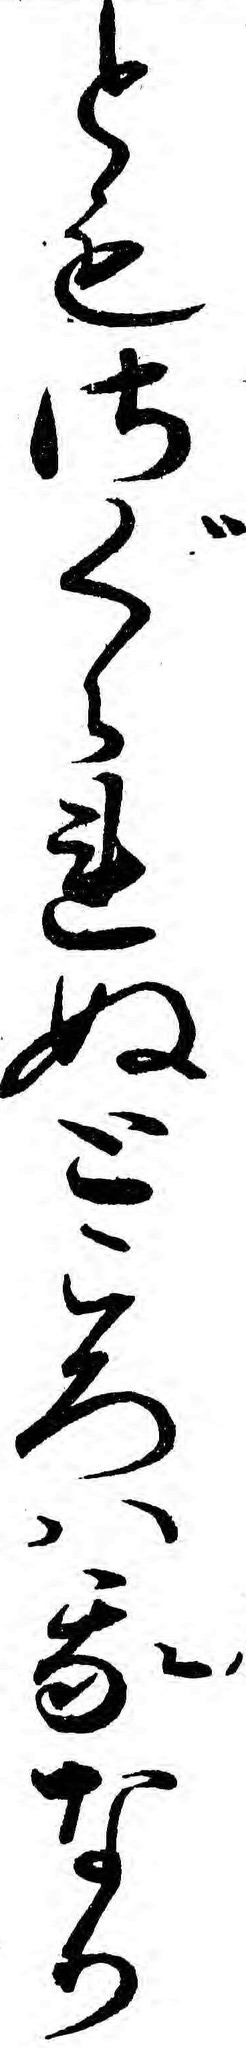ともさぐられぬところは我なり
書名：目なし用心抄
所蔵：国文学研究資料館
